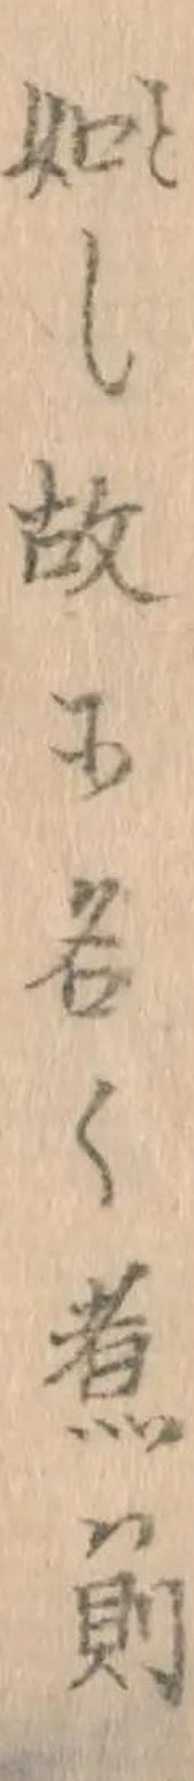如し故に名く煮は則
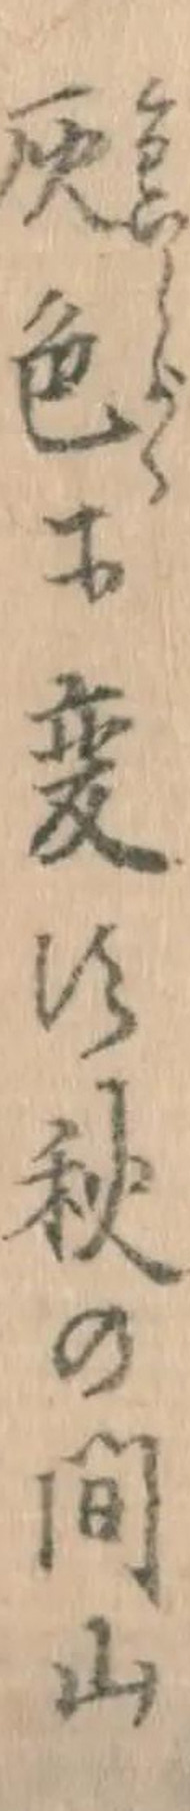灰色に変す秋の間山
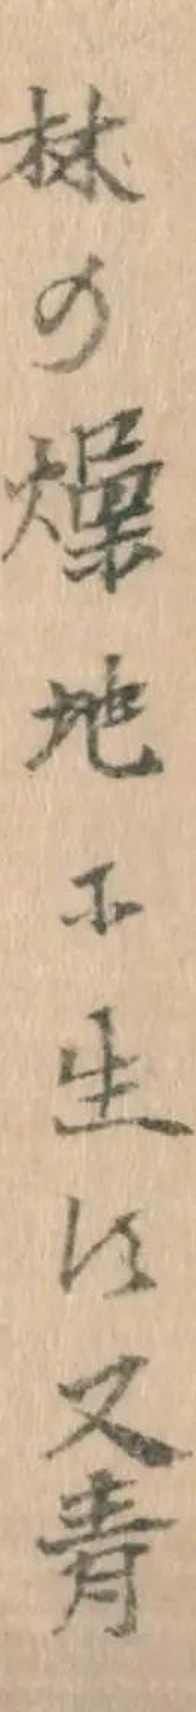林の燥地に生す又青
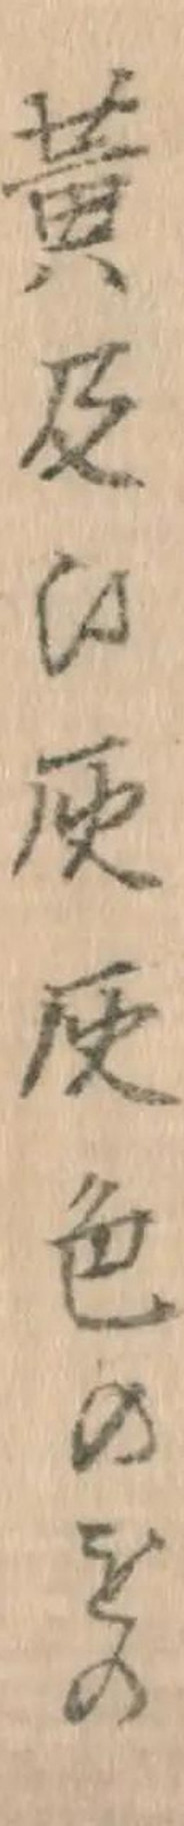黄及ひ灰灰色のもの
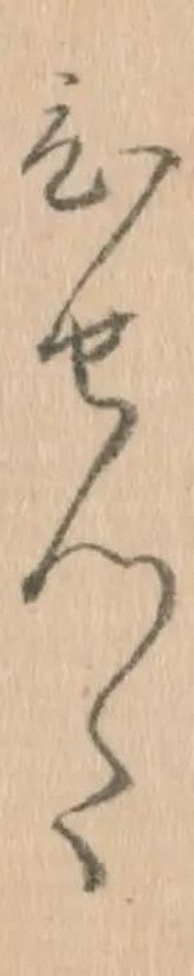ひせつた
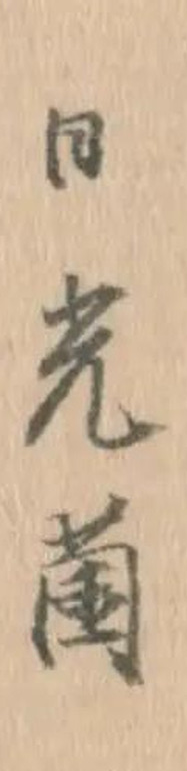日光菌
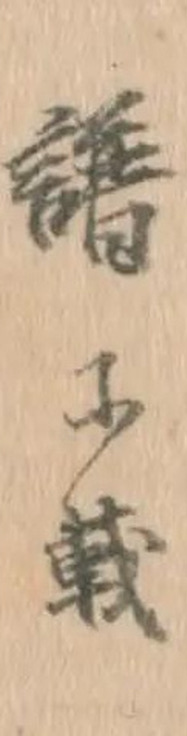譜に載

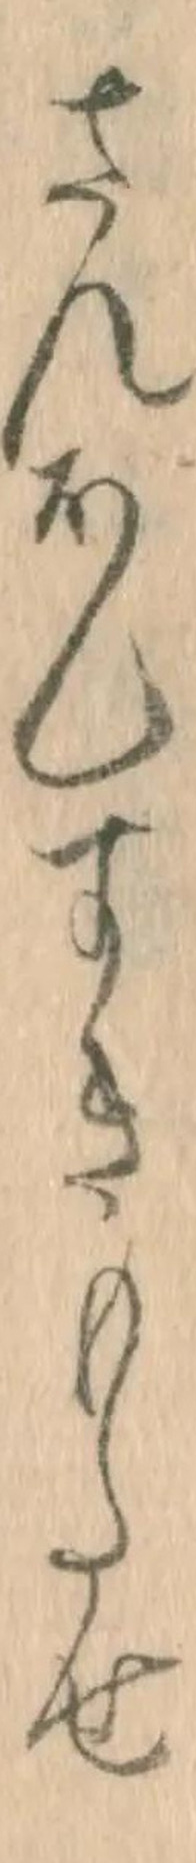さんほんすきもたせ
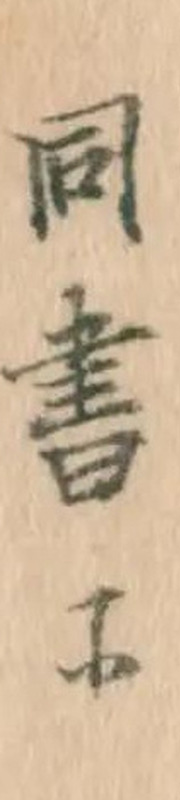同書に
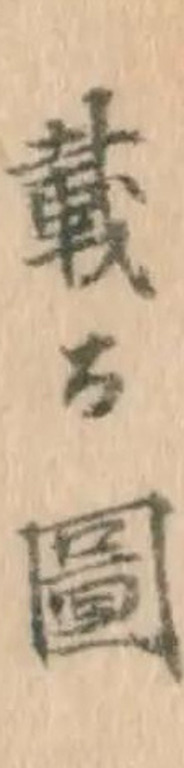載る図
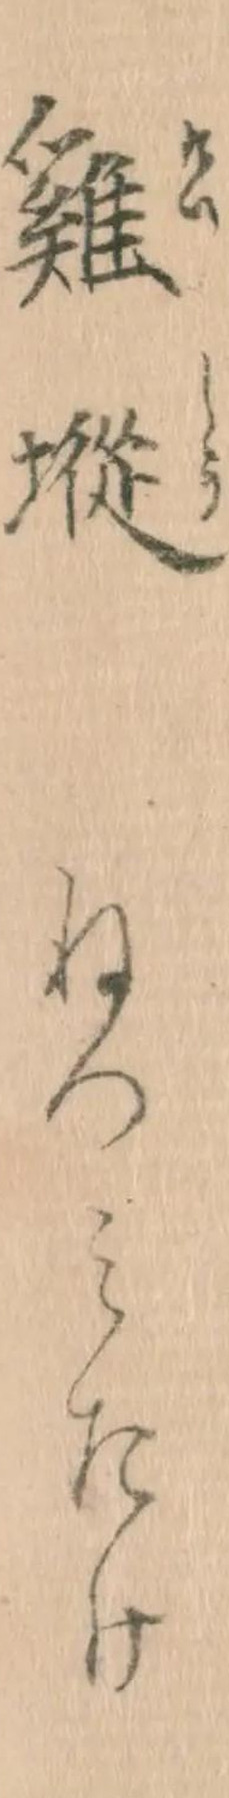鶏㙡ねつみたけ
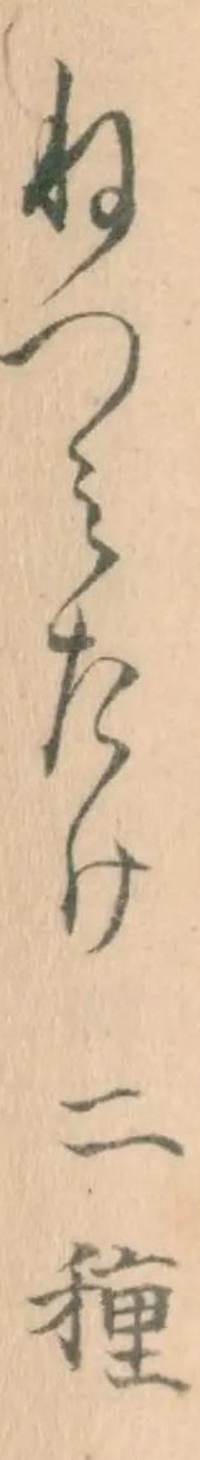ねつみたけ二種
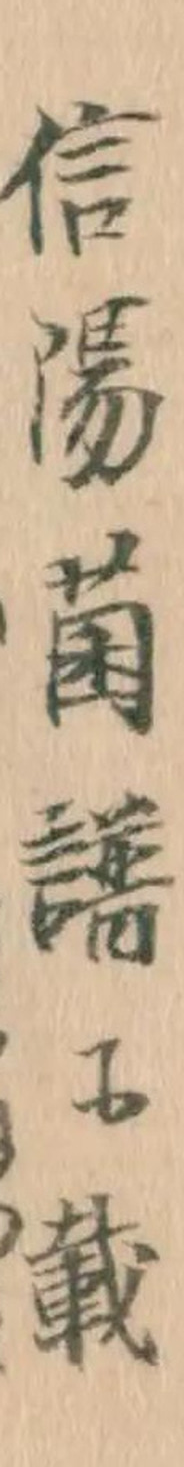信陽菌譜に載
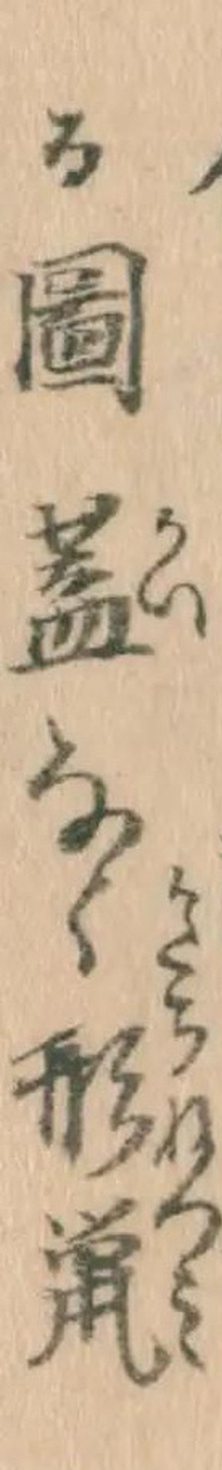る図蓋なく形鼠
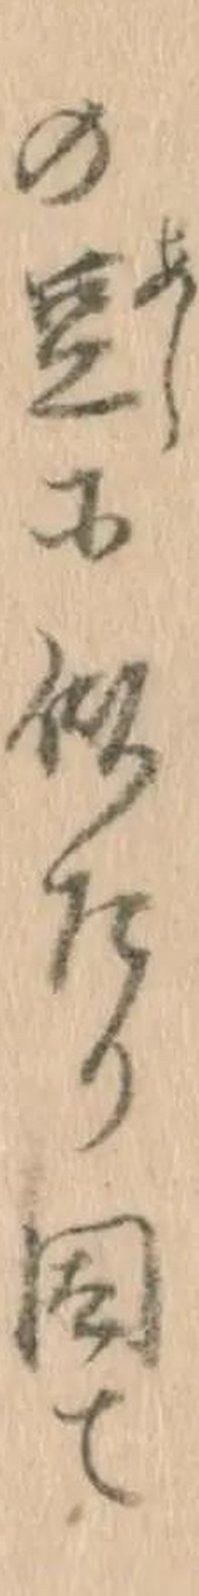の足に似たり因て
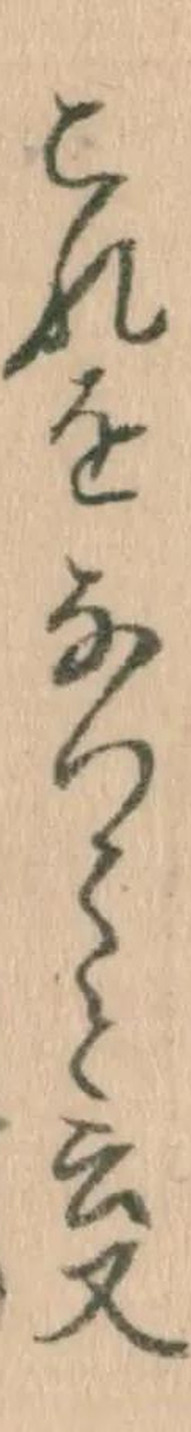これをなつくと云又
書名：本草図譜. 巻58-60
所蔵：国立国会図書館 National Diet Library, JAPAN
